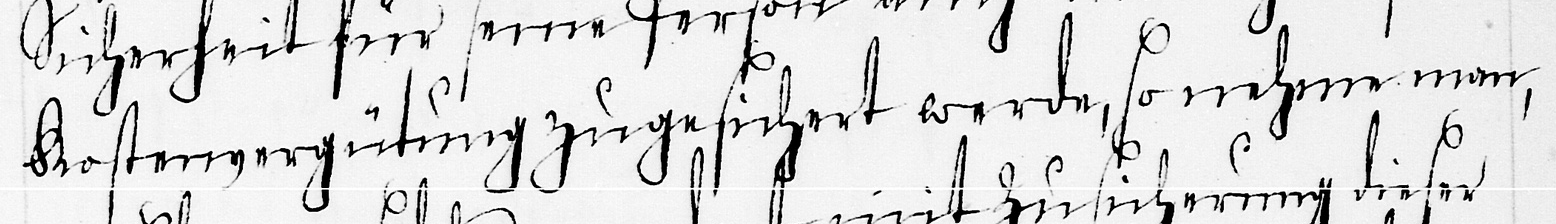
Kostenvergütung zugesichert werde, so nehme man,
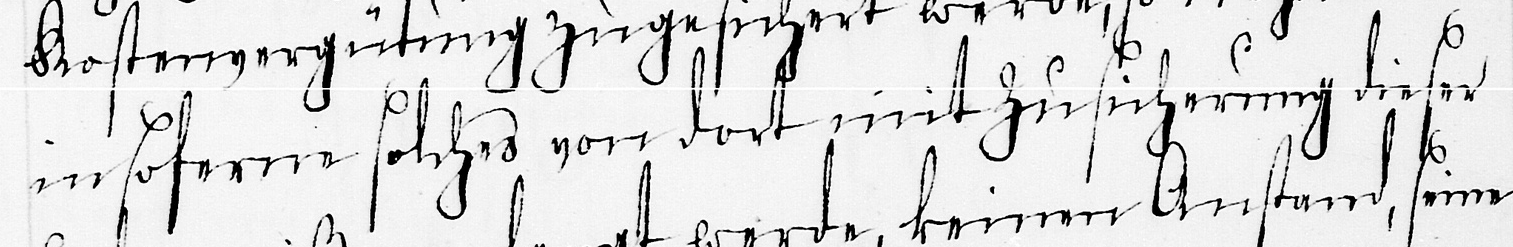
insoferne solches von dort mit Zusicherung dieser
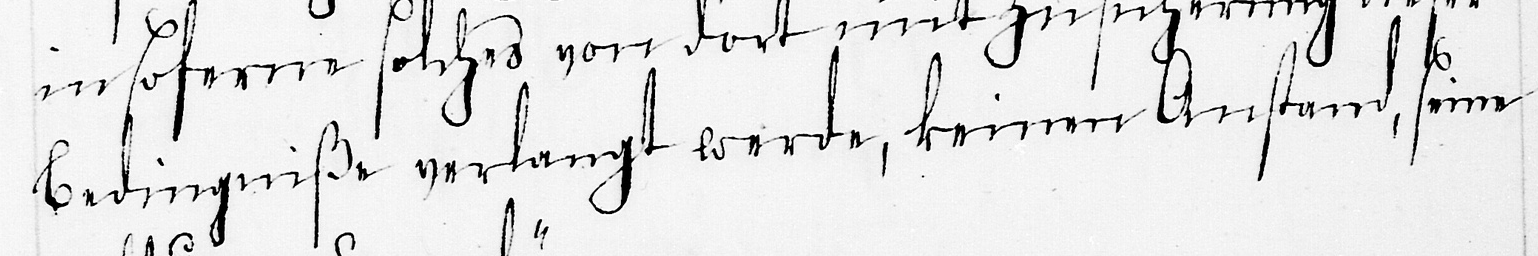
Bedingniße verlangt werde, keinen Anstand, seine
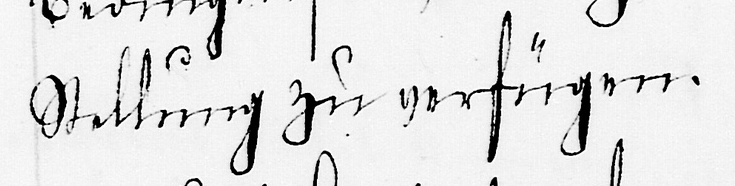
Stellung zu verfügen.
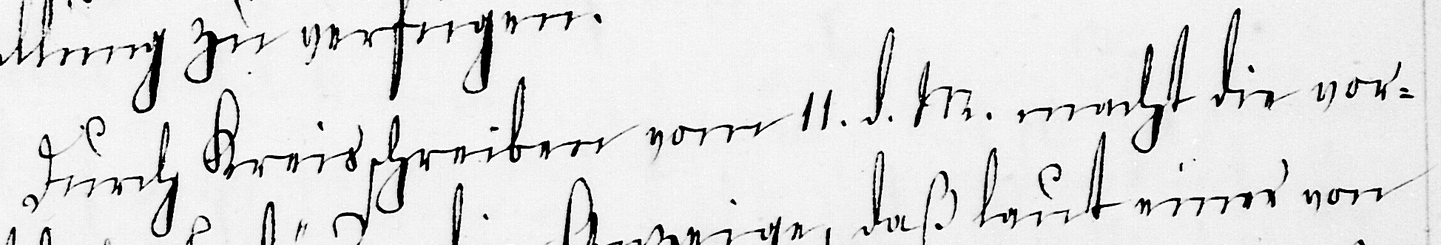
Durch Kreisschreiben vom 11. d. M. macht die vor¬
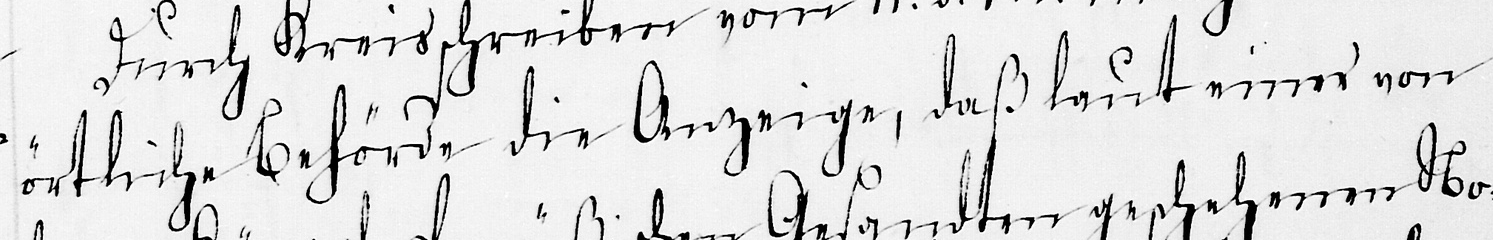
örtliche Behörde die Anzeige, daß laut einer von
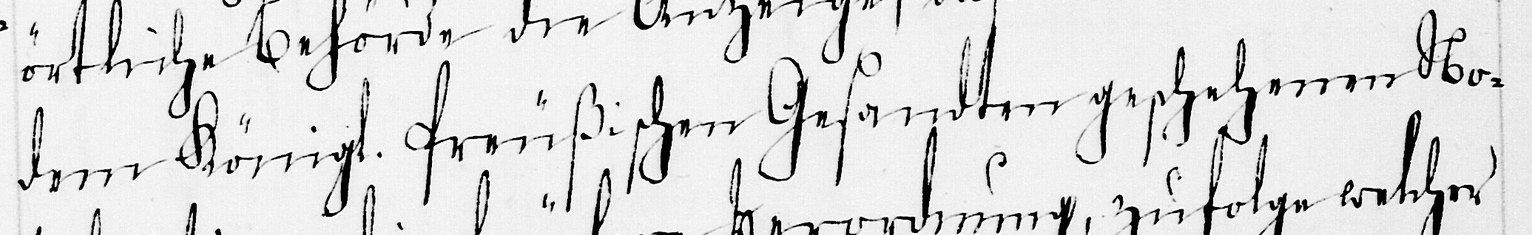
dem Königl. Preußischen Gesandten geschehenen No¬
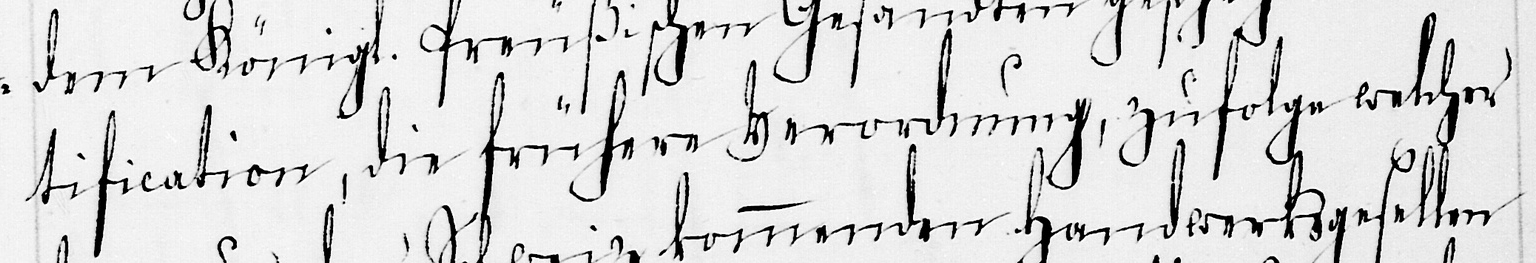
tification, die frühere Verordnung, zufolge welcher
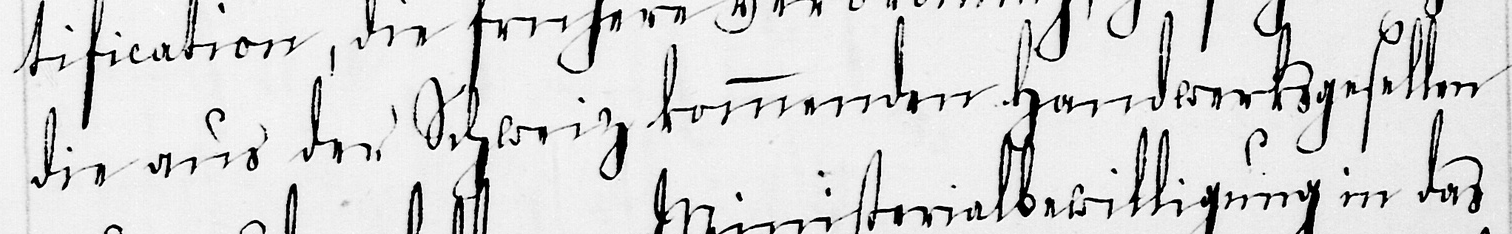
die aus der Schweiz kommenden Handwerksgesellen
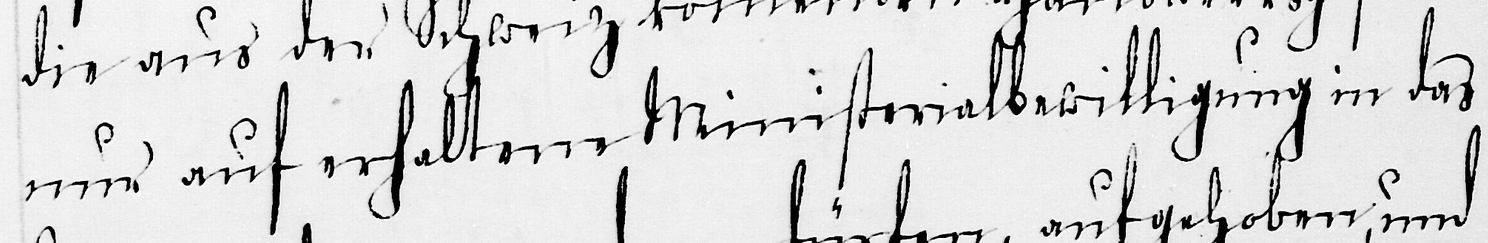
nur auf erhaltene Ministerialbewilligung in das
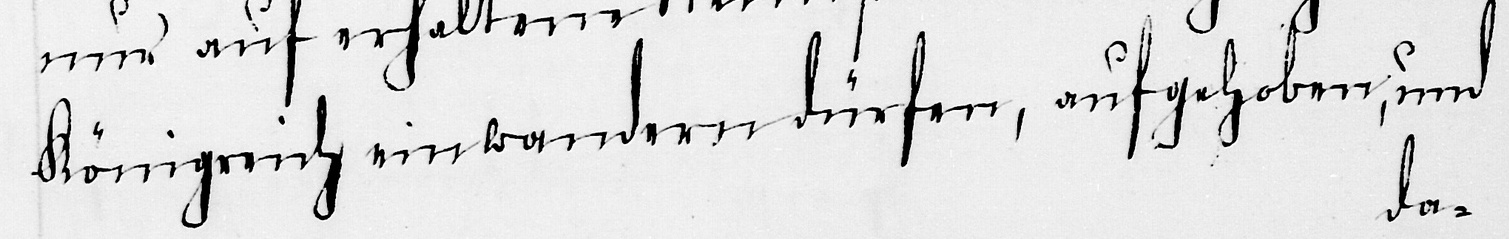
Königreich einwandern dürfen, aufgehoben, und
